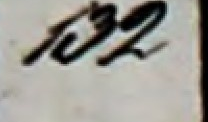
132
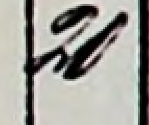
20
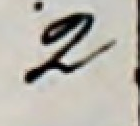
2
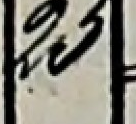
25
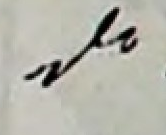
Do
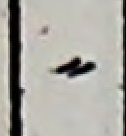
„
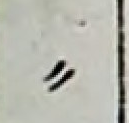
„
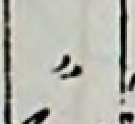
„
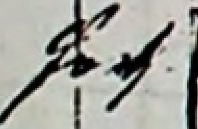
Joch
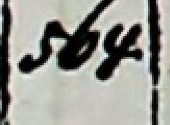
564
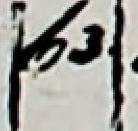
63
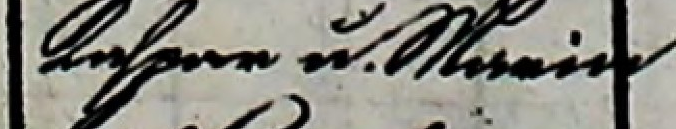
Kaspar u. Maria
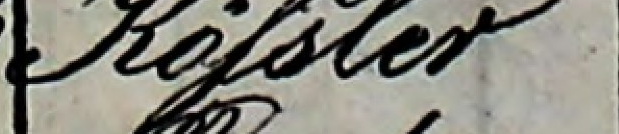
Kössler
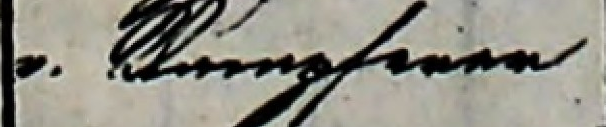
v. Kanzferer
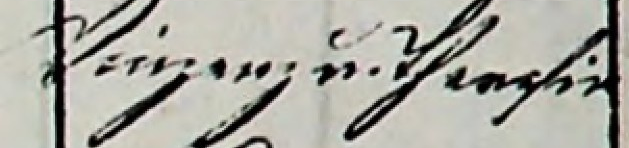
Vinzen u. Theresia
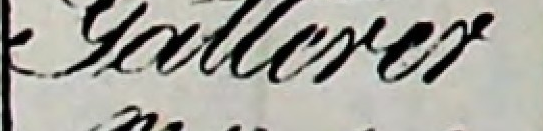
Gatterer
